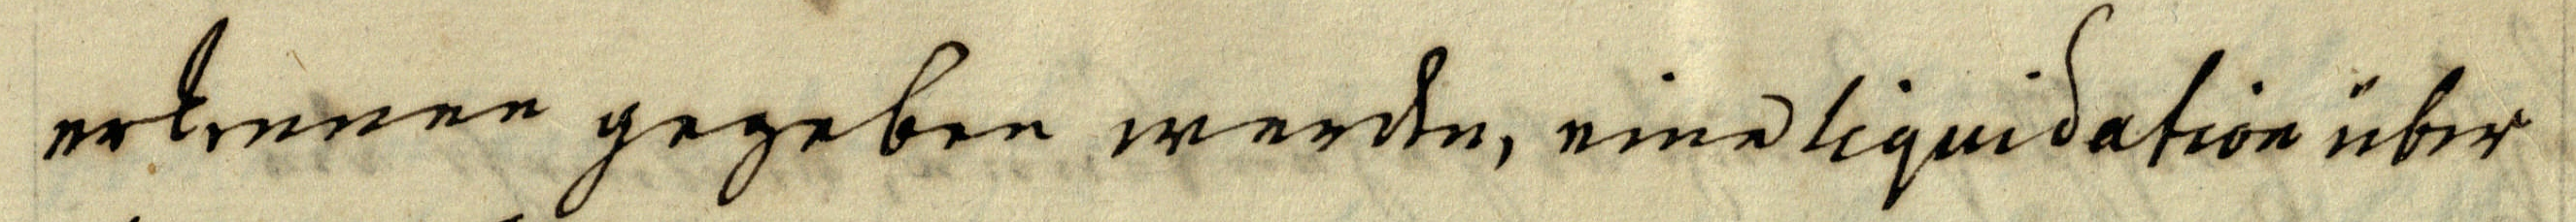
erkennen gegeben werden, eine liquidation über
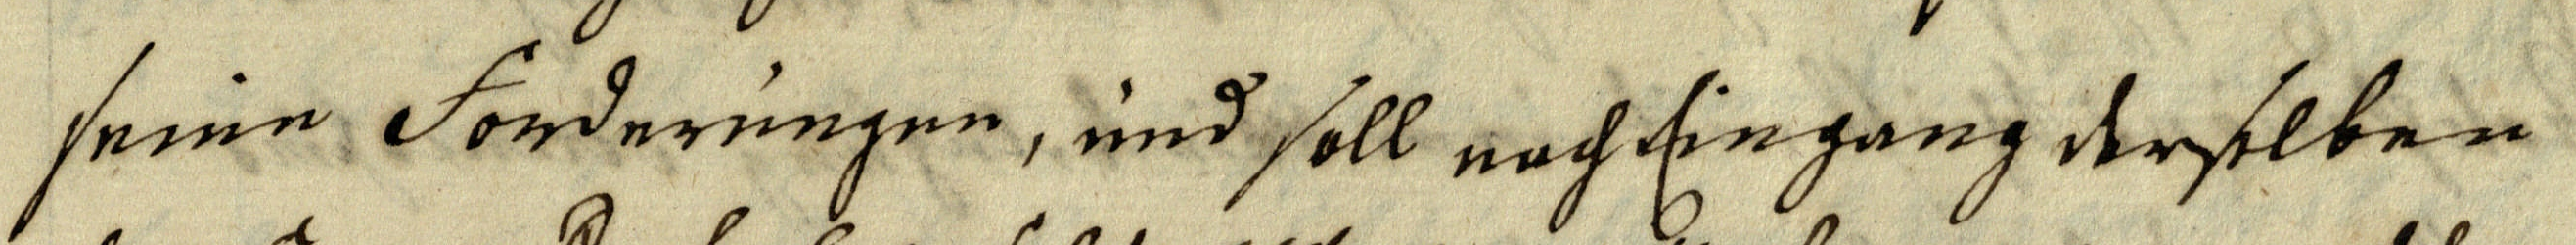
seine Forderungen, und soll nach Eingang derselben
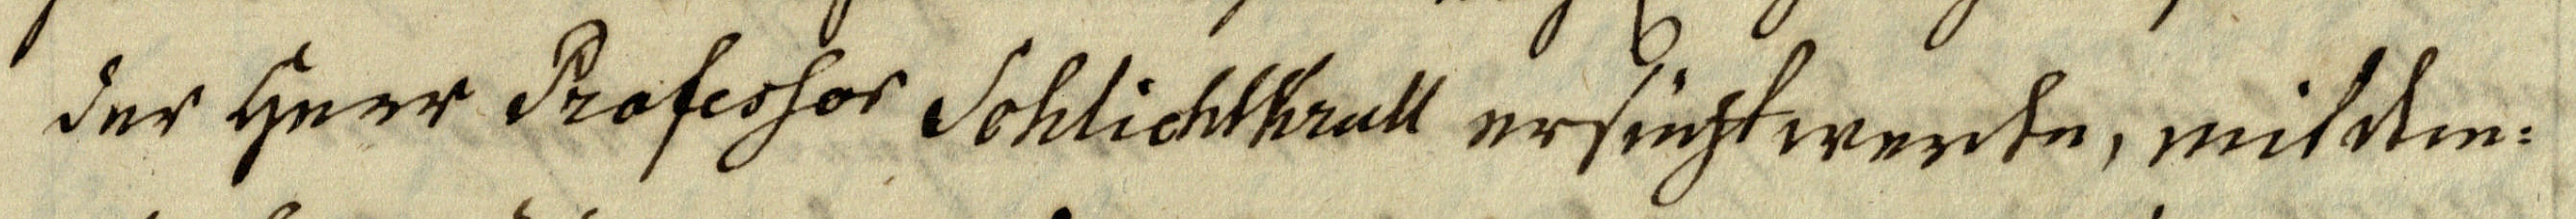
der Herr Professor Schlichtkrull ersucht werden, mit dem¬
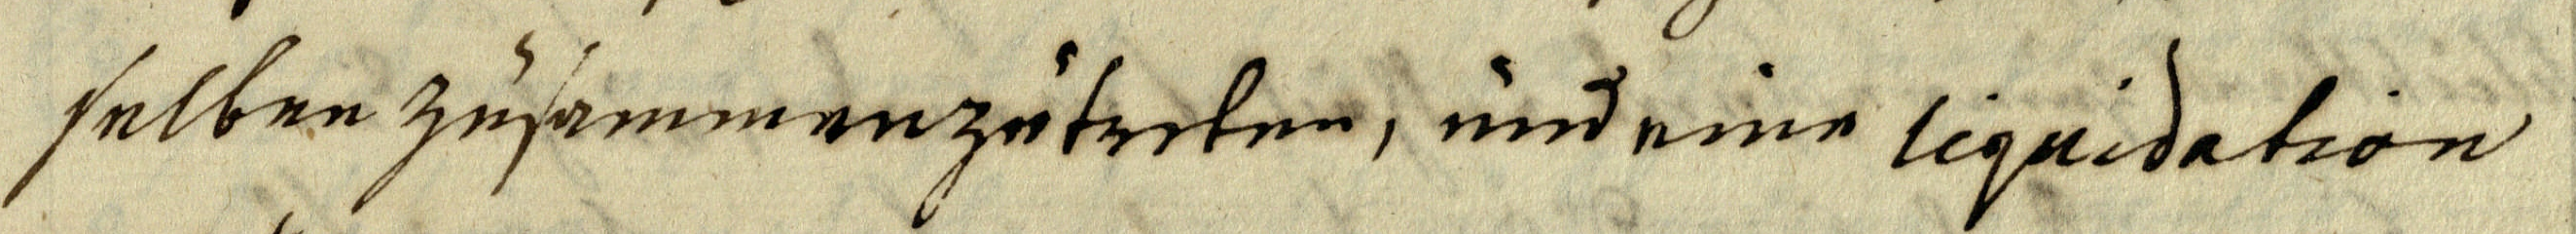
selben zusammenzutreten, und eine liquidation
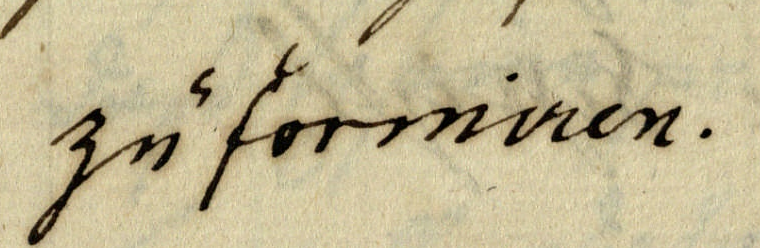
zu formiren.
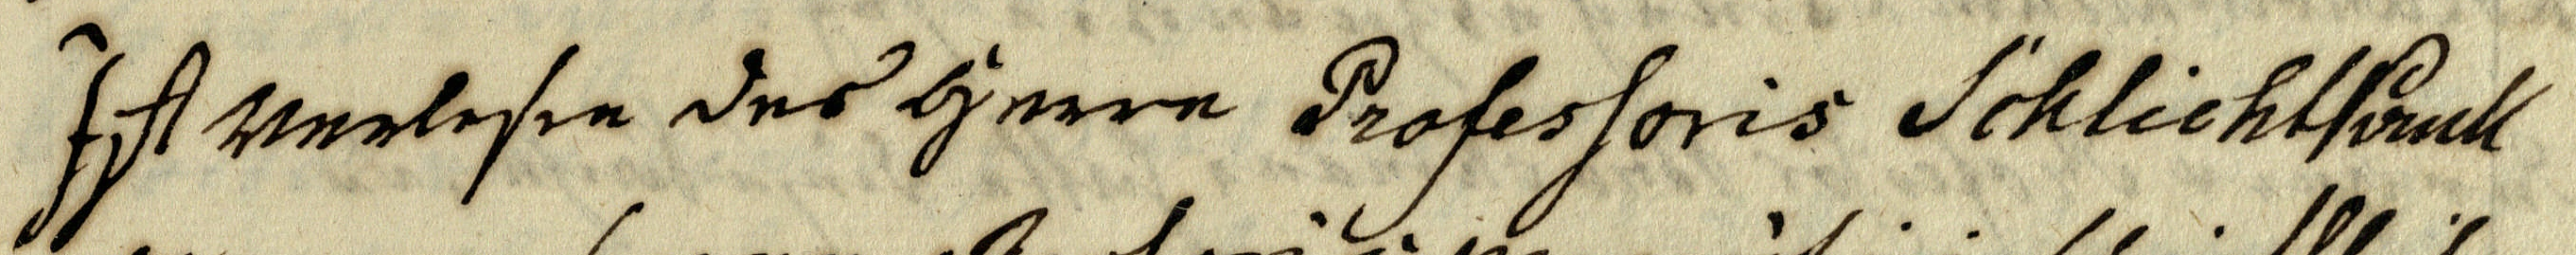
Ist verlesen des Herrn Professoris Schlichtkrull
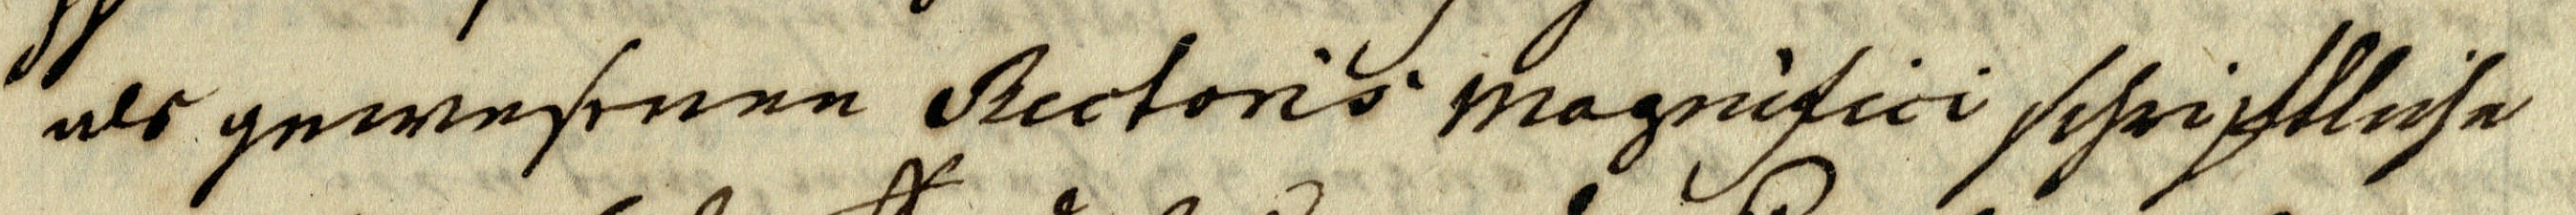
als gewesenen Rectoris Magnifici schriftliche
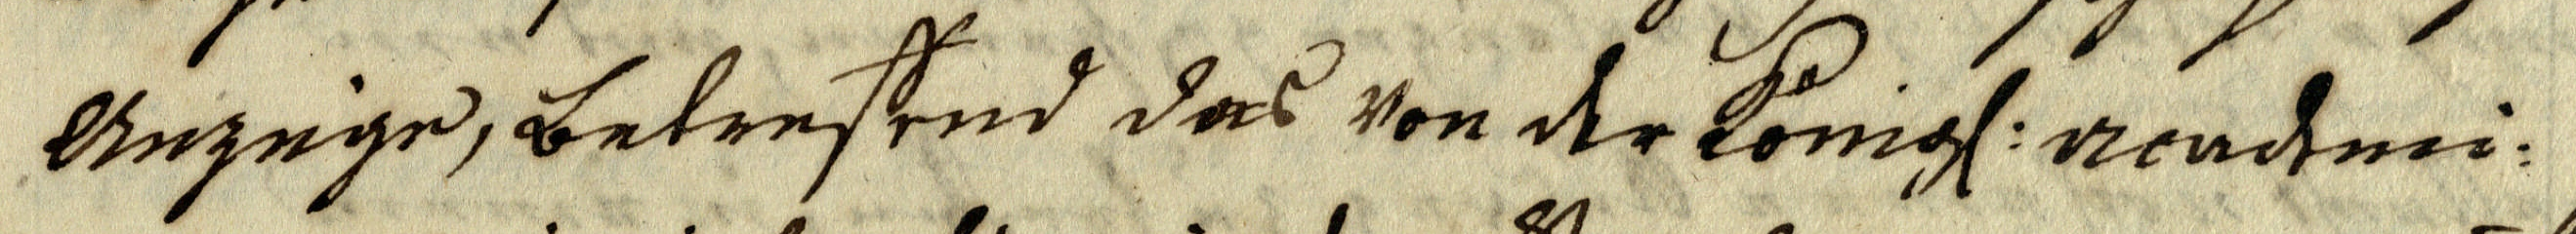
Anzeige, betreffend das von der Königl. academi¬
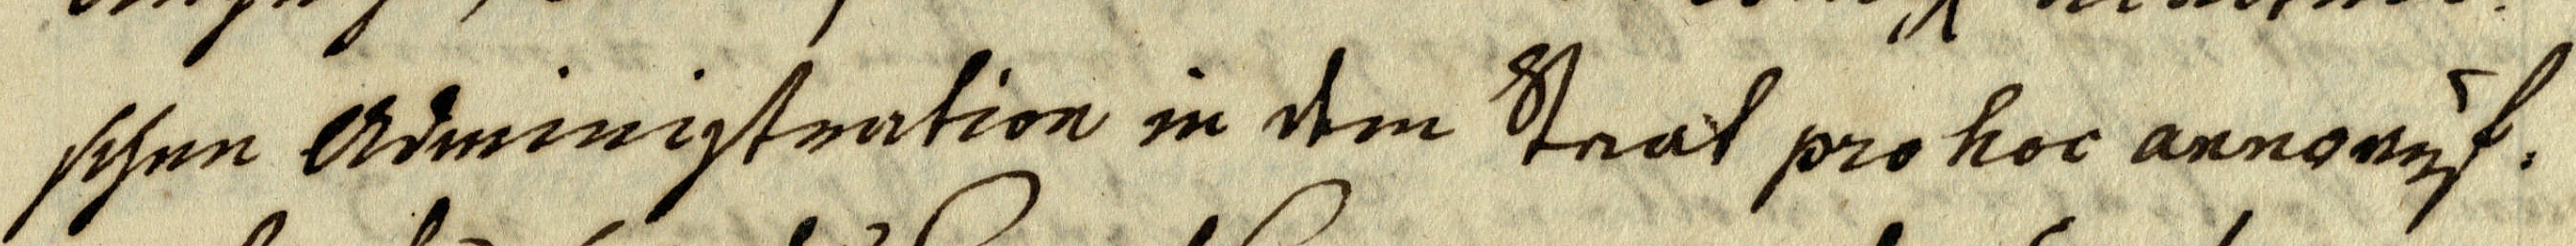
schen Administration in dem Staat pro hoc anno auf¬
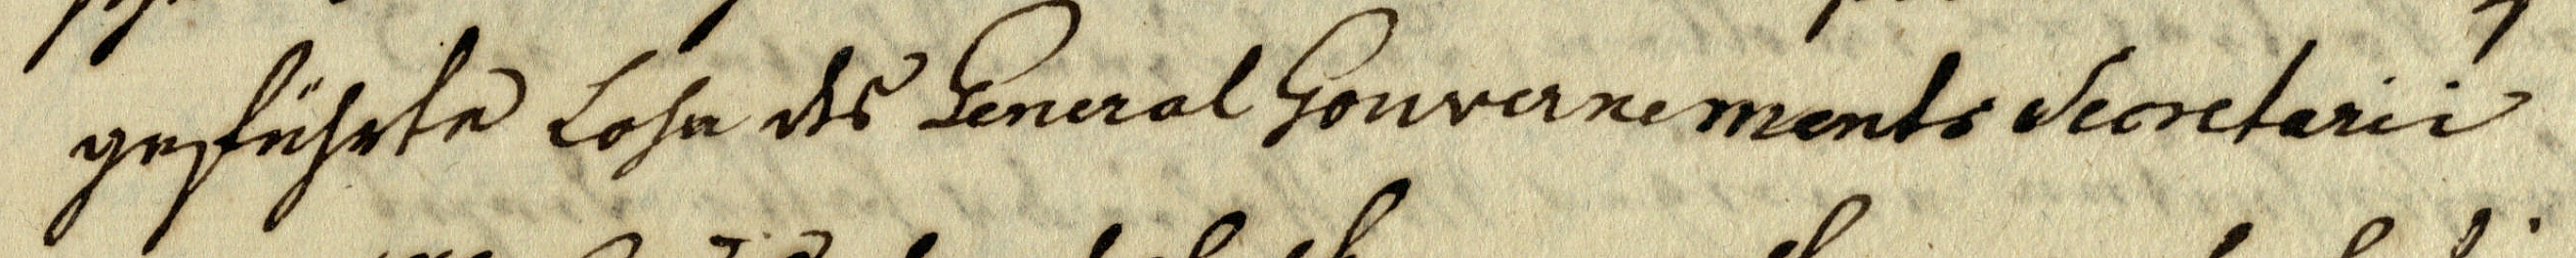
geführte Lohn des General Gouvernements Secretarii
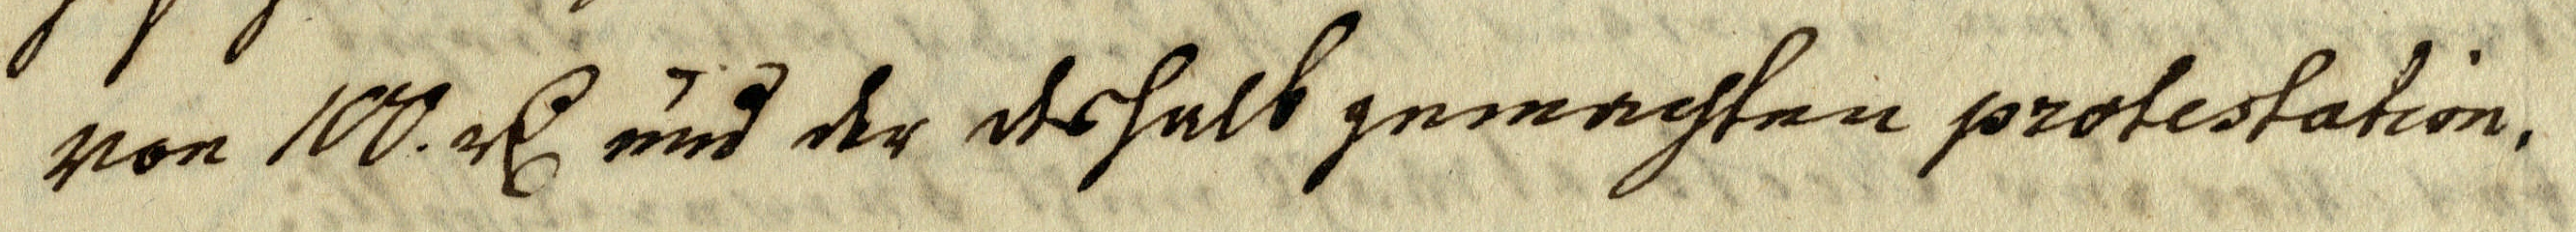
von 100 r. und der deshalb gemachten protestation.
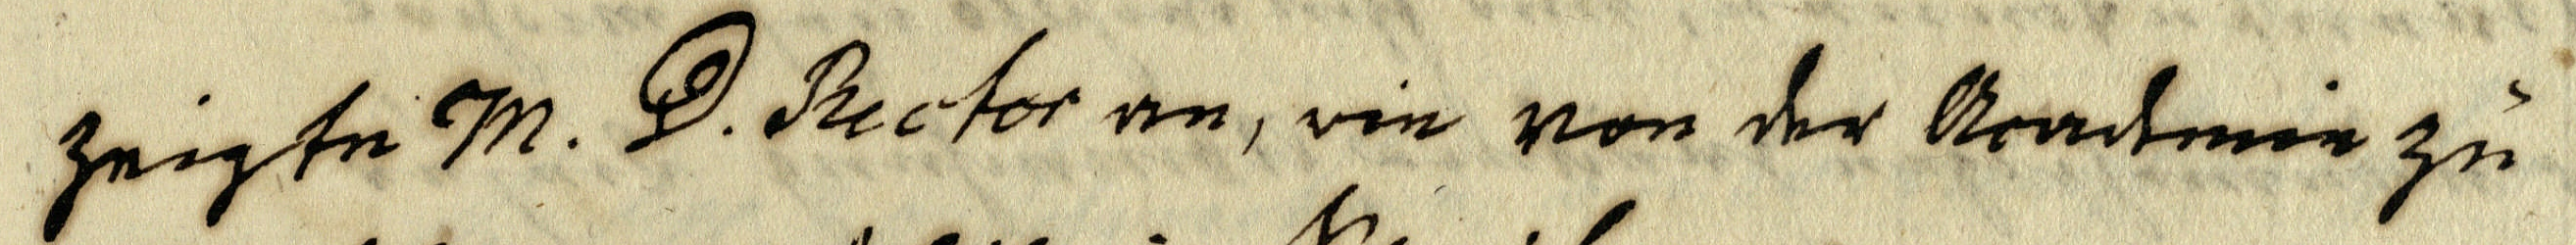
Zeigte M. D. Rector an, wie von der Academie zu
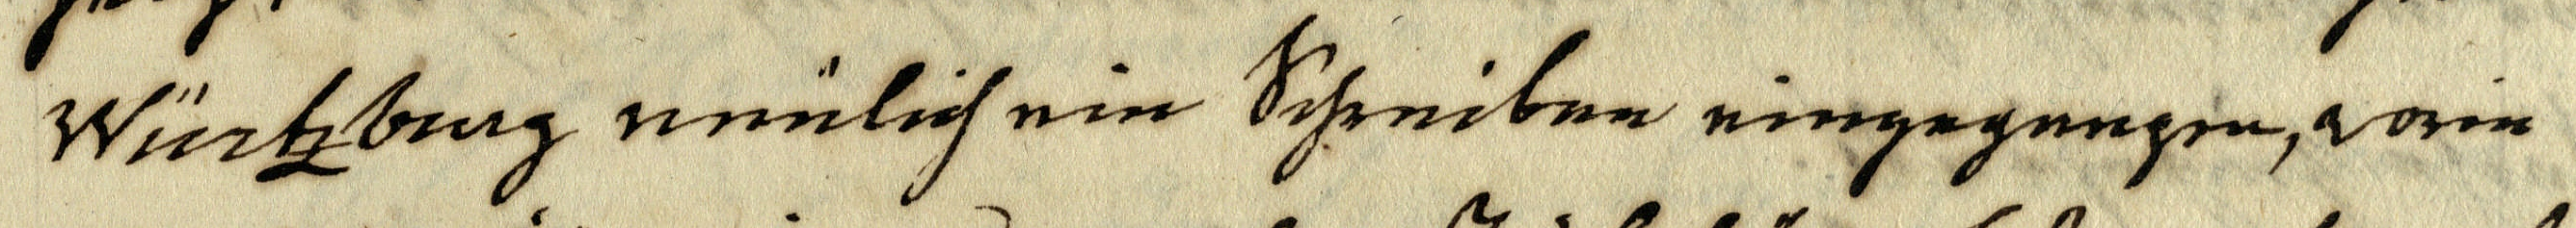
Würtzburg neulich ein Schreiben eingegangen, worin
